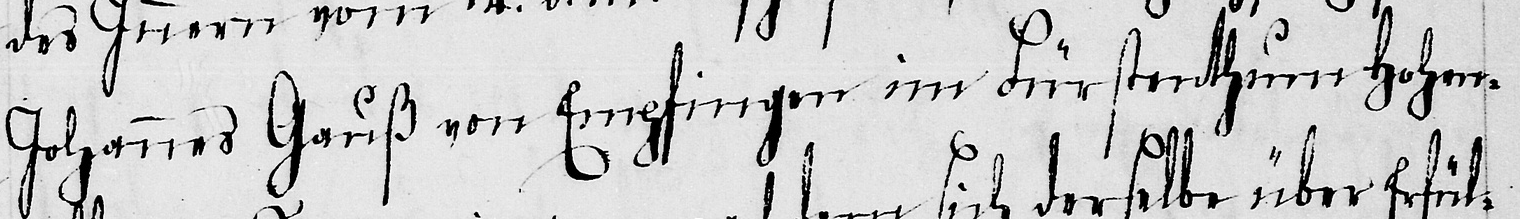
Johannes Gauß von Emphingen im Fürstenthum Hohen¬
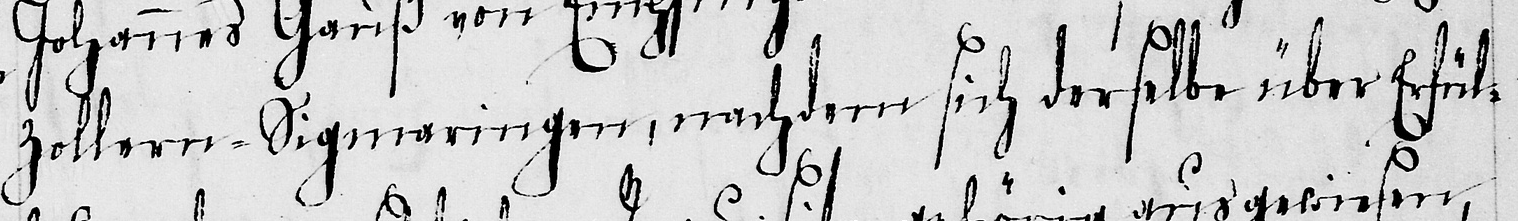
zollern-Sigmaringen, nachdem sich derselbe über Erfül¬
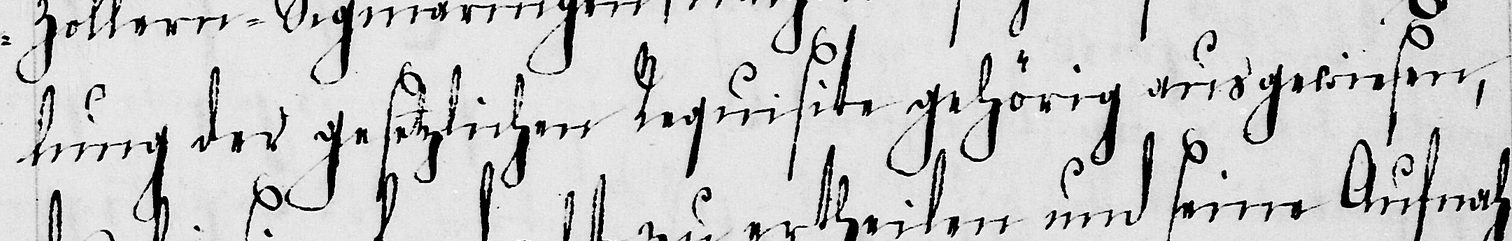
lung der gesetzlichen Requisite gehörig ausgewiesen,
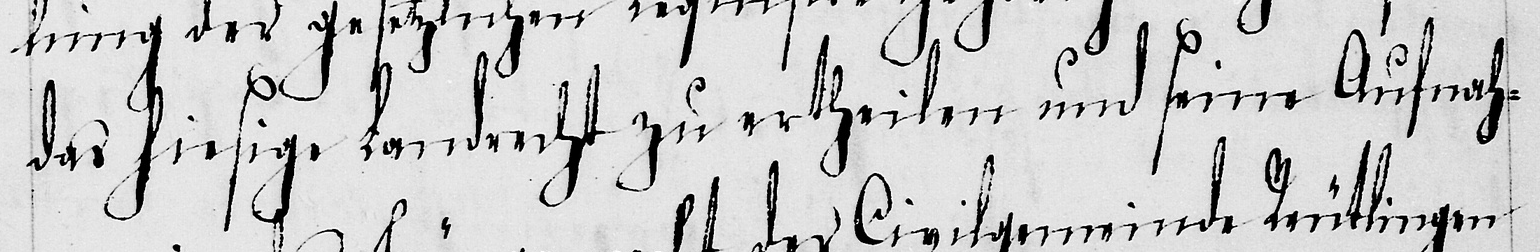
das hiesige Landrecht zu ertheilen und seine Aufnah¬
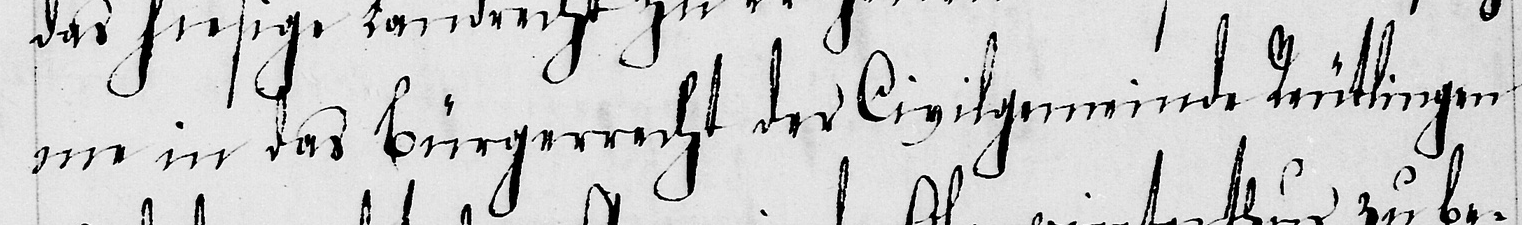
me in das Bürgerrecht der Civilgemeinde Reutlingen
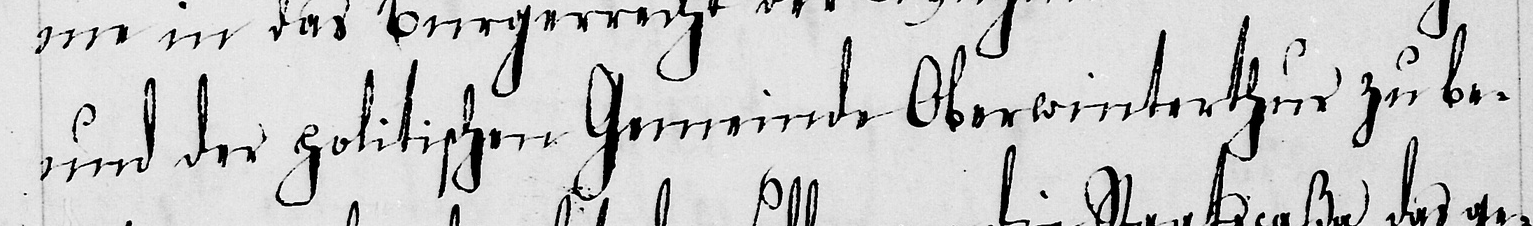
und der polititschen Gemeinde Oberwinterthur zu be¬
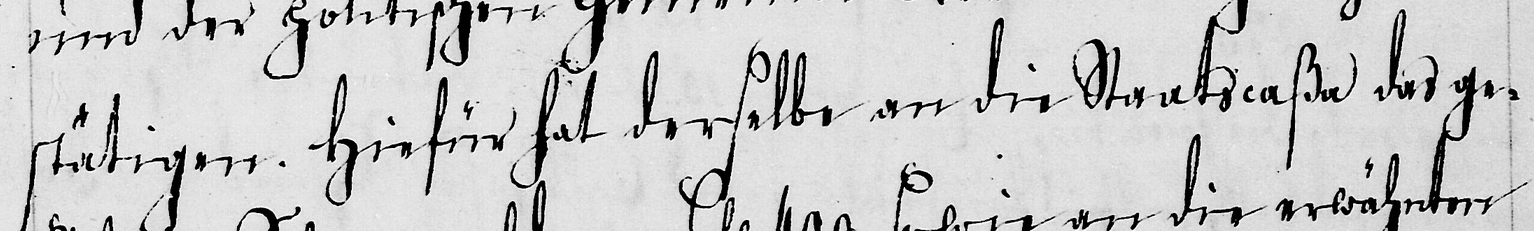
stätigen. Hiefür hat derselbe an die Staatscaßa das ge¬
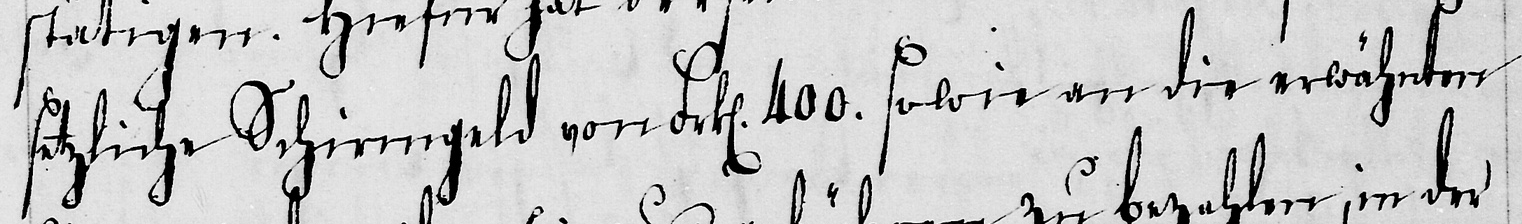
setzliche Schirmgeld von Frk[en]. 400. sowie an die erwähnten
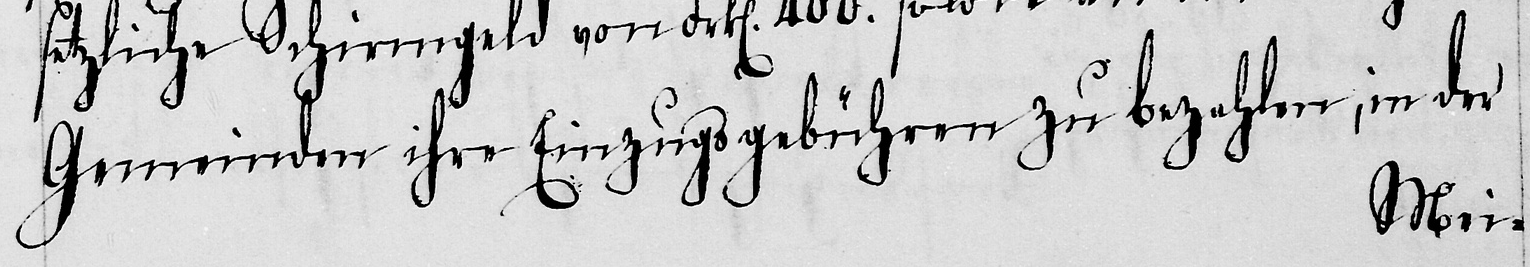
Gemeinden ihre Einzugsgebühren zu bezahlen, in der
